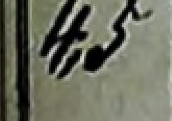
4,5
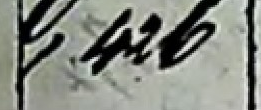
0,426
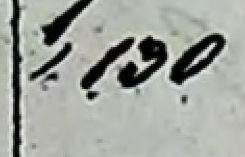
1,130
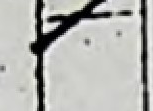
7
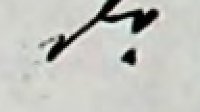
do
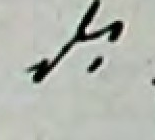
do
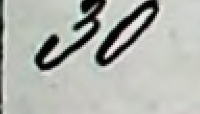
30
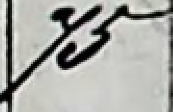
75
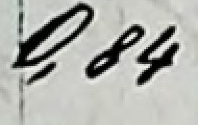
0,84
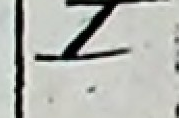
I
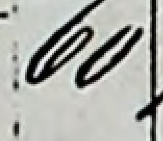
60
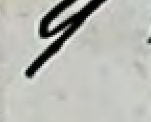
9
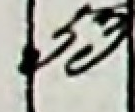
53
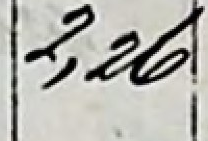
2,26
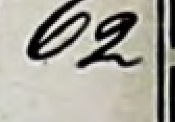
62
